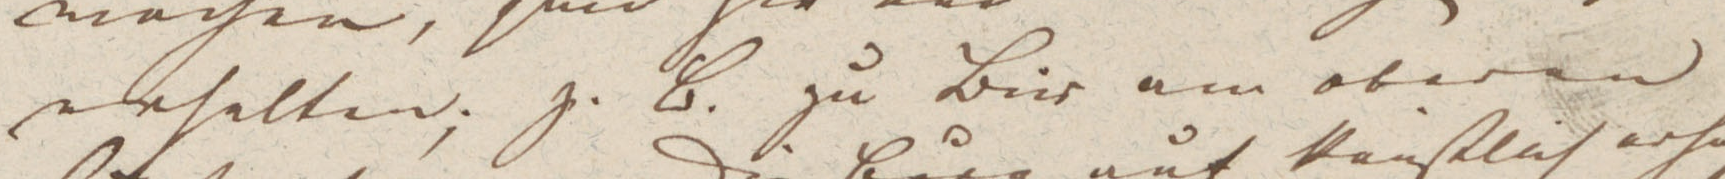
erhalten; z. B. zu Bir am oberen
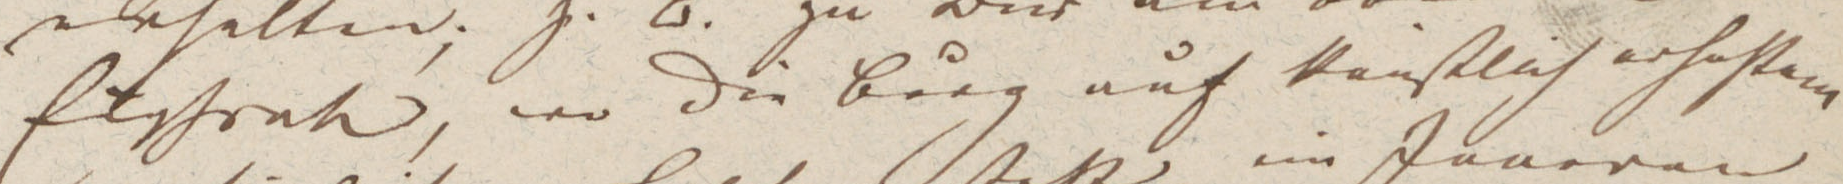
Euphrat, wo die Burg auf künstlich erhohtem
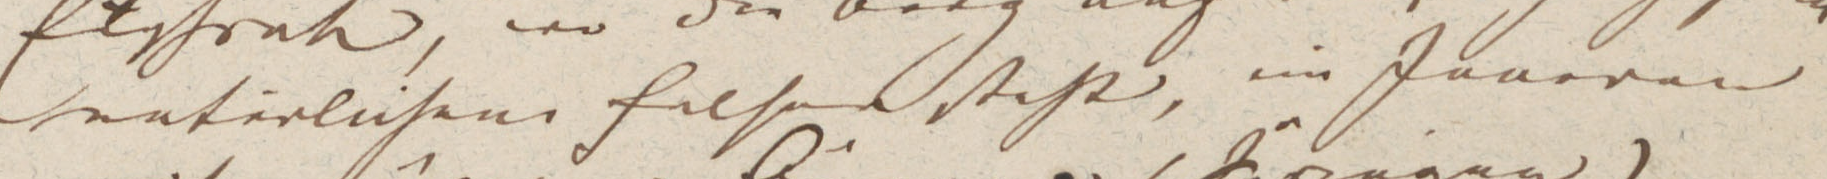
natürlichem Felsen steht, im Inneren
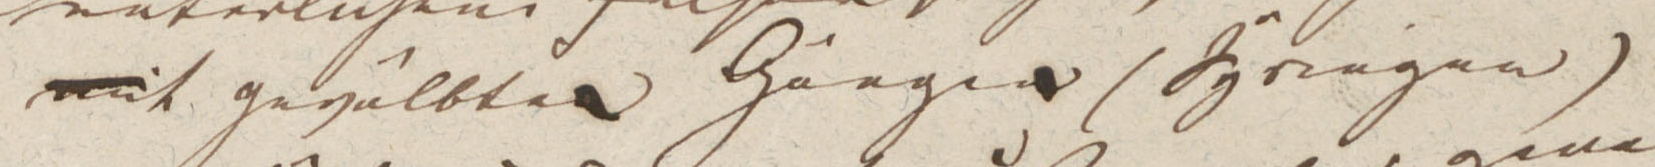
mit gewölbten Gängen (Syringen)
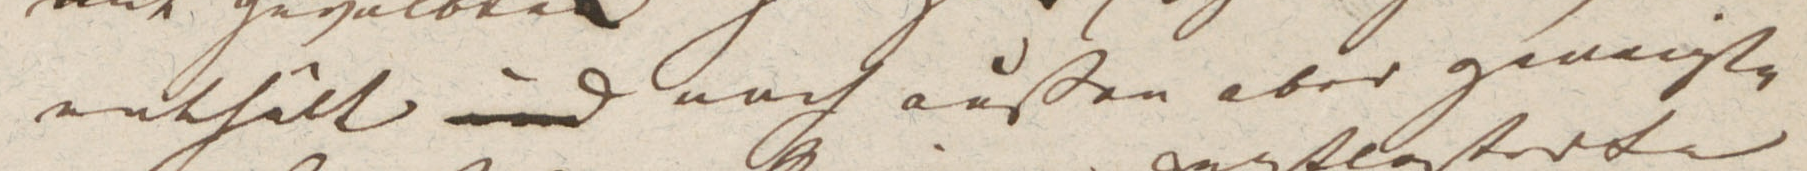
enthält und nach aussen aber geneigte
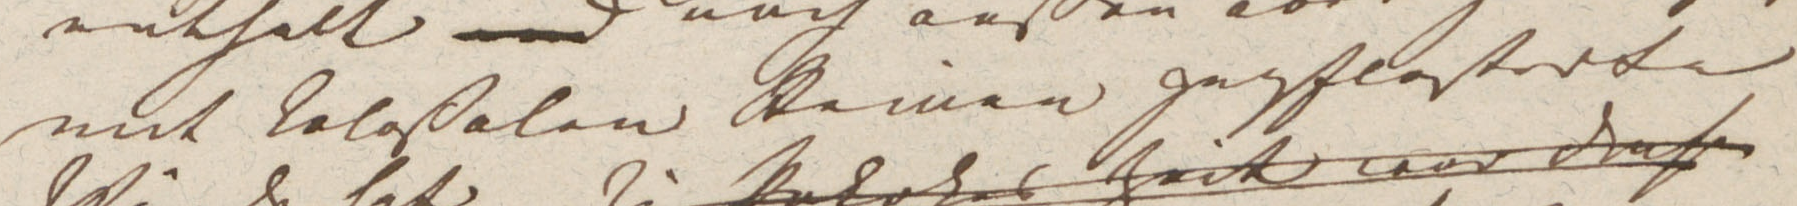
mit kolossalen Steinen gepflasterte
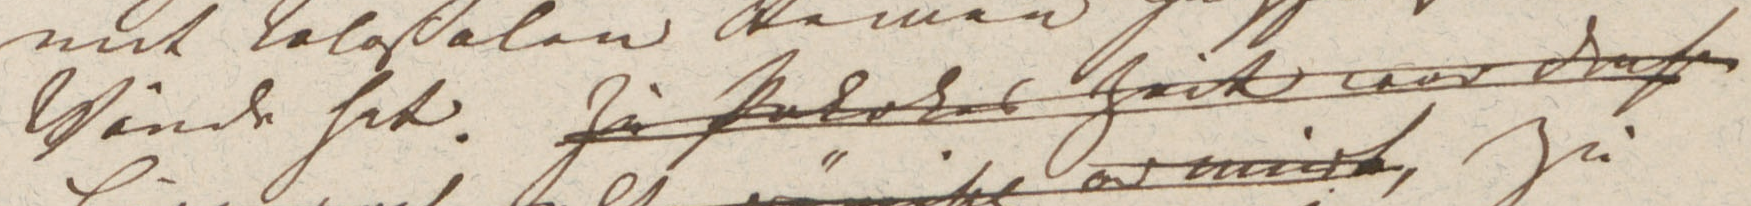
Wände hat. Zu Pokokes Zeit war diese
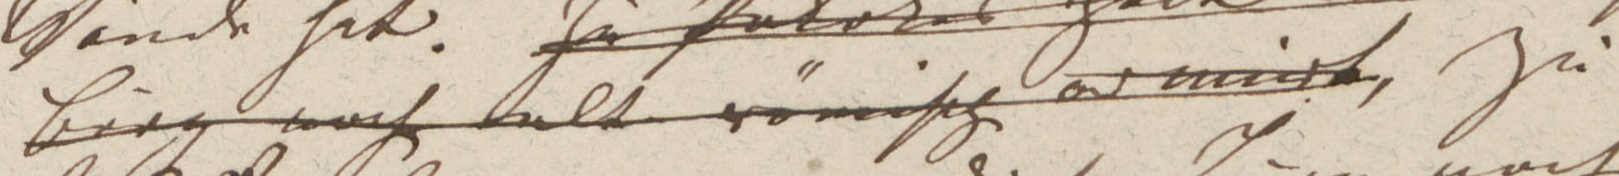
Burg noch alt-römisch armirt, Zu
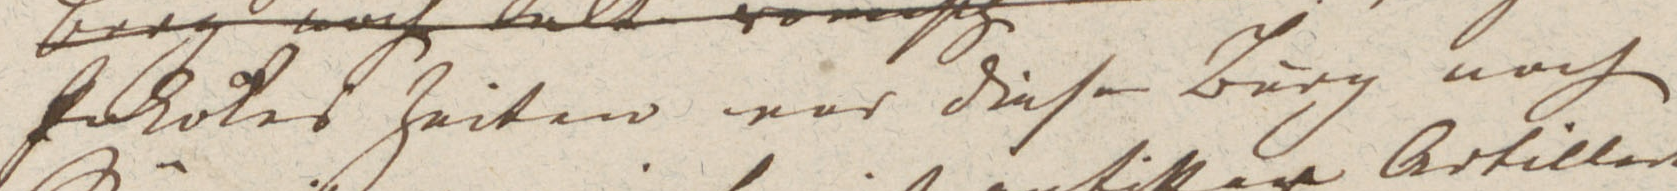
Pokokes Zeiten war diese Burg noch
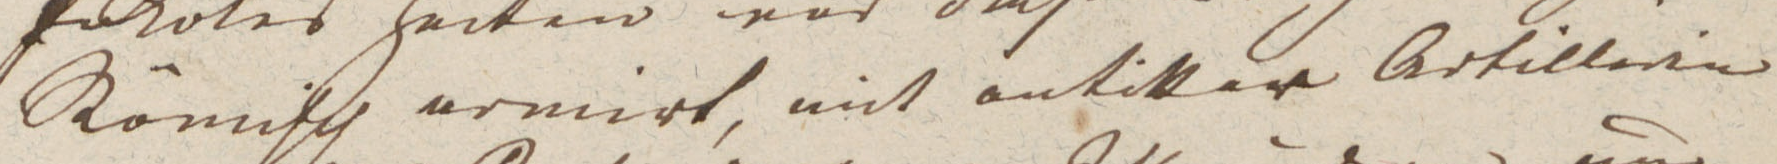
Römisch armirt, mit antiker Artillerie
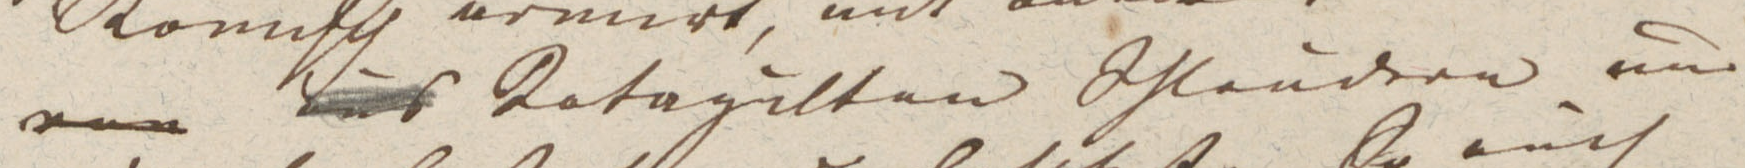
von aus Katapulten Schleudern und
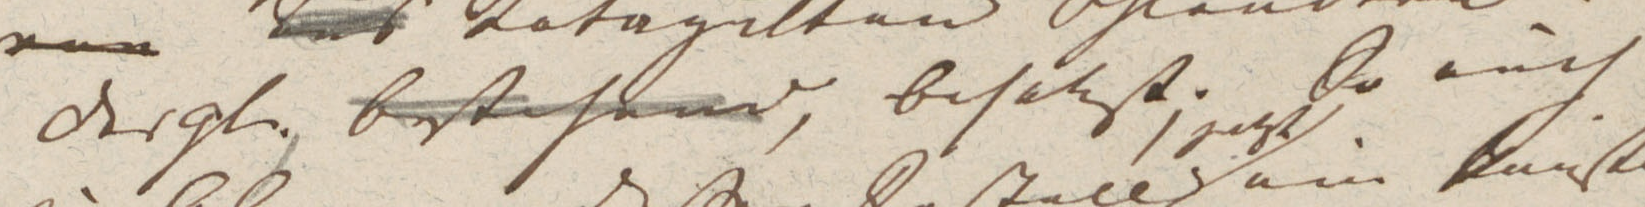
dergl., bestehend, besetzt. So auch
